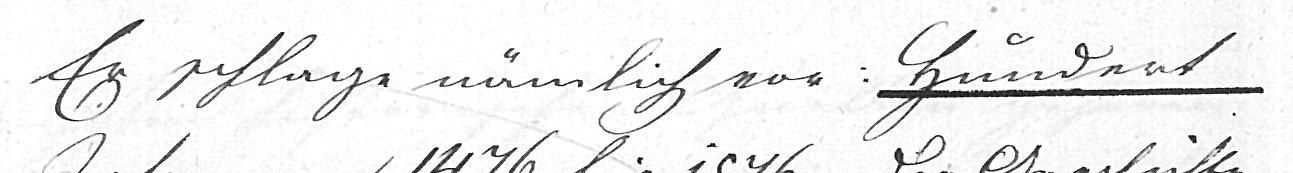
Es schlage nämlich vor: Hundert
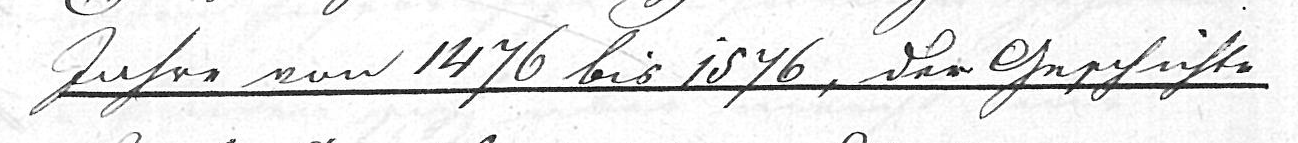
Jahre von 1476 bis 1576, der Geschichte
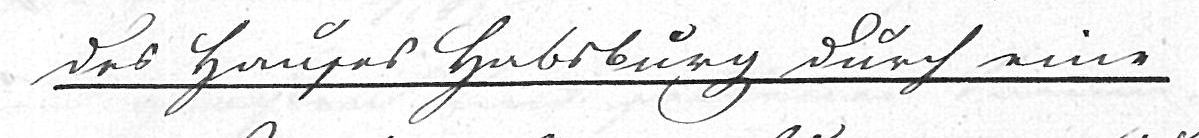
des Hauses Habsburg durch eine
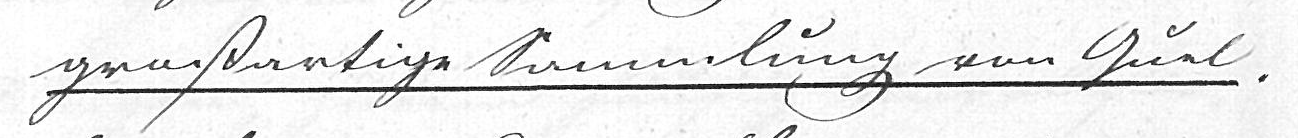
großartige Sammlung von Quel-
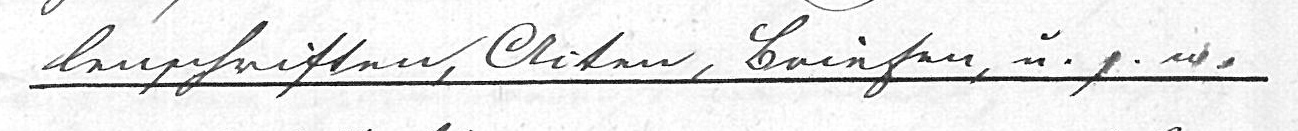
lenschriften, Acten, Briefen, u.s.w.
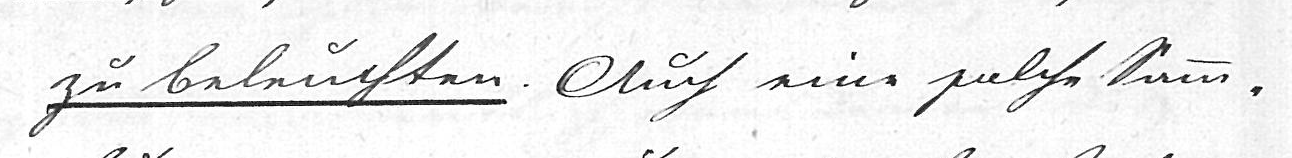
zu beleuchten. Auch eine solche Samm-
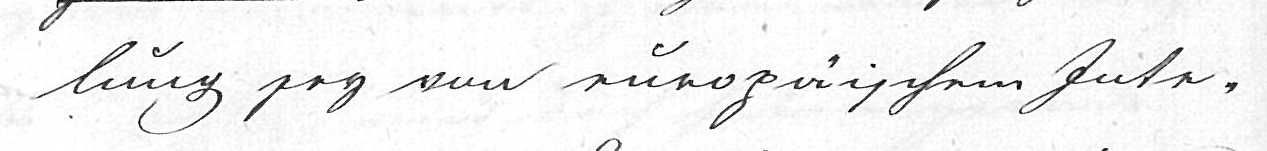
lung sey von europäischem Inte-
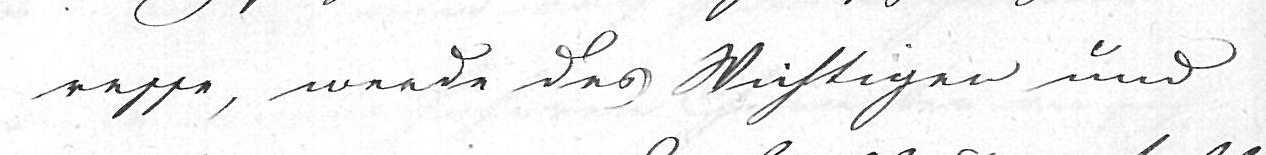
resse, werde des Wichtigen und
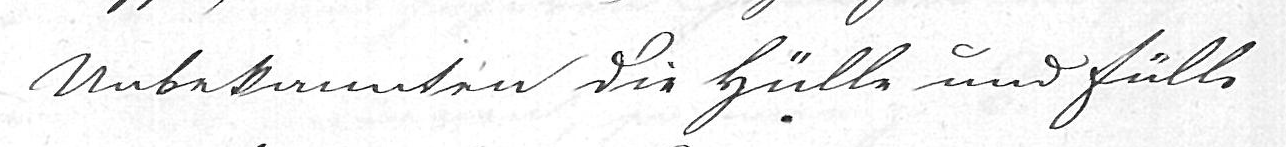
Unbekannten die Hülle und Fülle
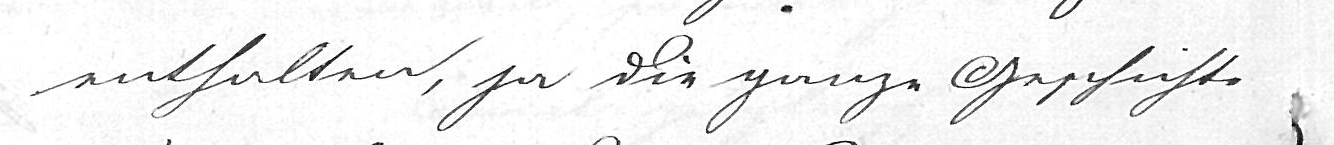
enthalten, ja die ganze Geschichte
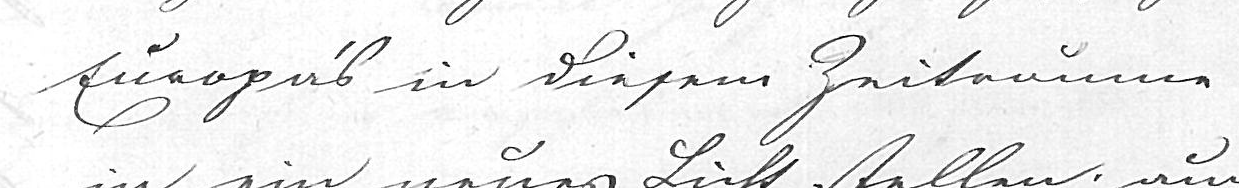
Europa's in diesem Zeitraume
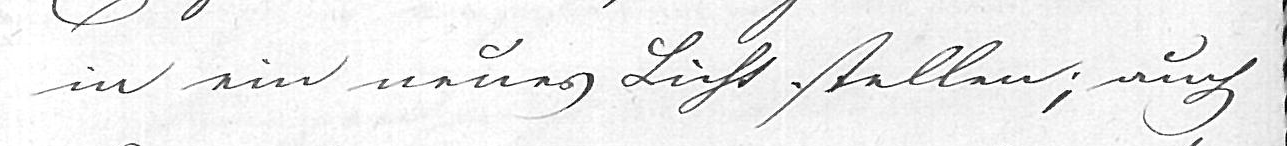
in ein neues Licht stellen; auch
